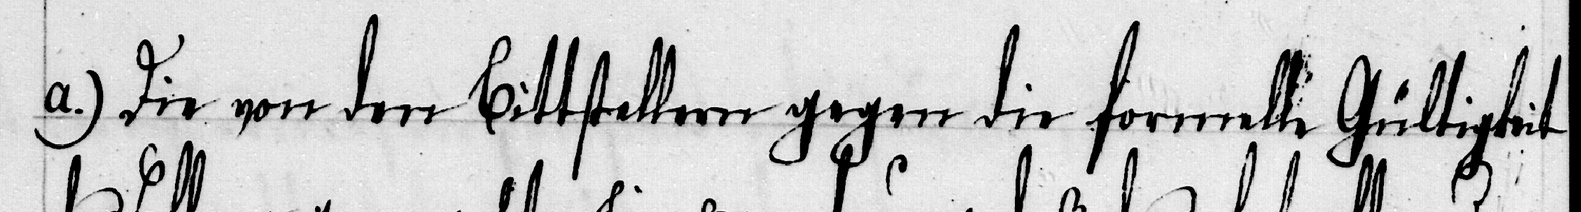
a.) Die von den Bittstellern gegen die formelle Gültigkeit
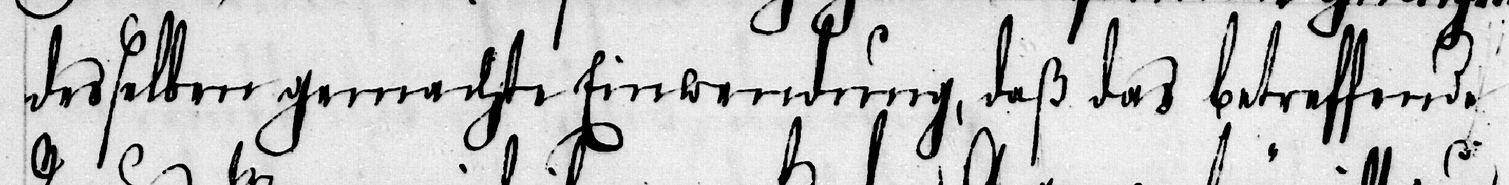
desselben gemachte Einwendung, daß das betreffende
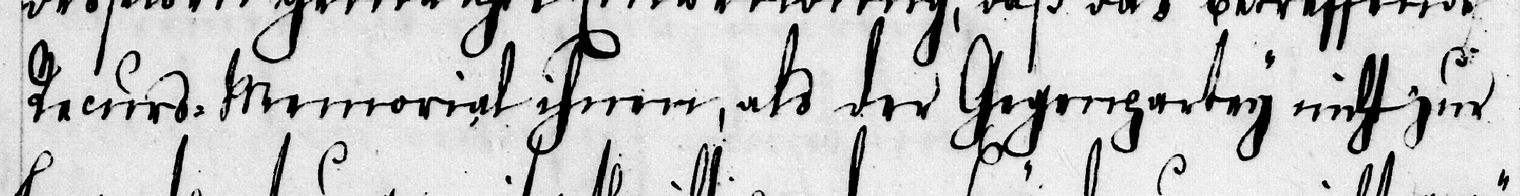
Recurs-Memorial ihnen, als der Gegenpartey nicht zur
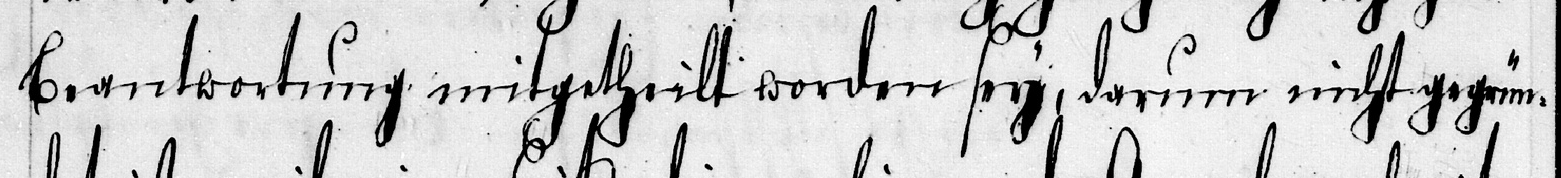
Beantwortung mitgetheilt worden sey, darum nicht gegrün¬
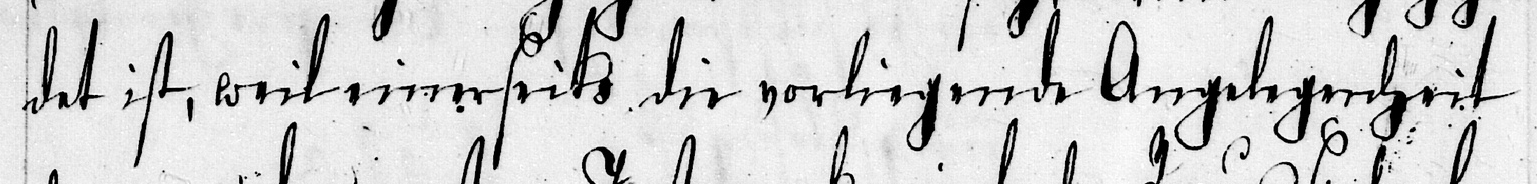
det ist, weil einerseits die vorliegende Angelegenheit
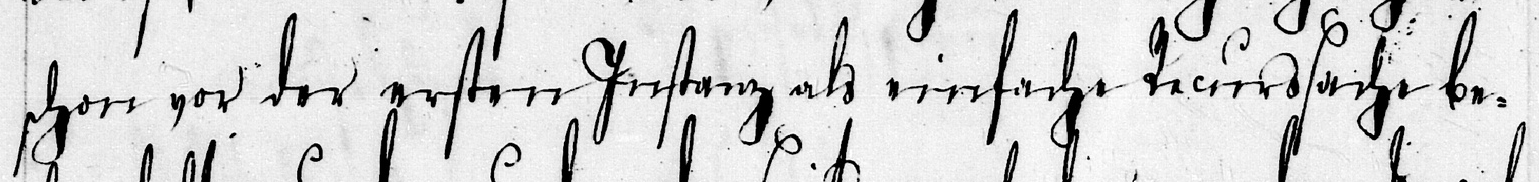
schon vor der ersten Instanz als einfache Recurssache be¬
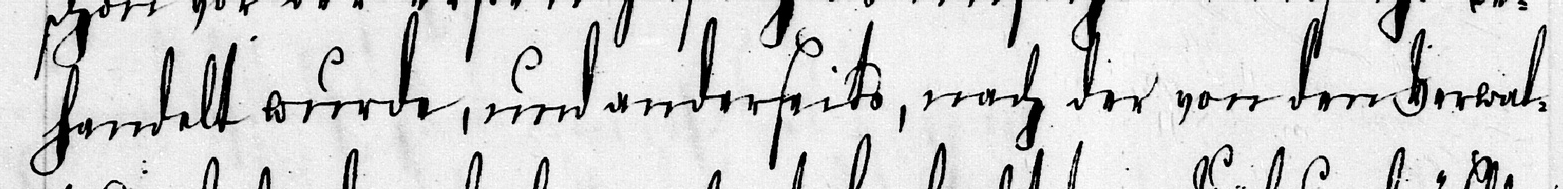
handelt wurde, und anderseits, nach der von den Verwal¬
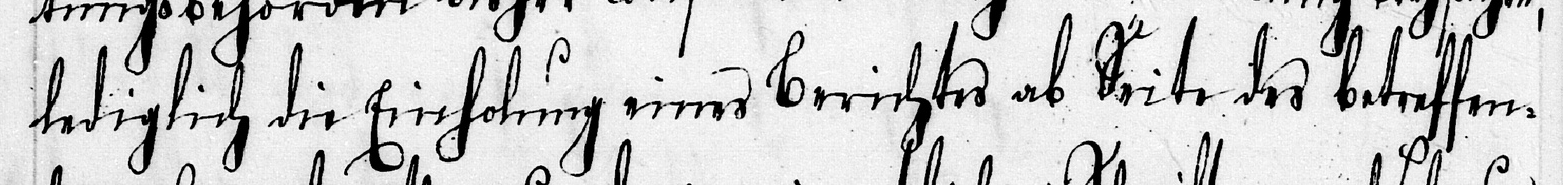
lediglich die Einholung eines Berichtes ab Seite des betreffen¬
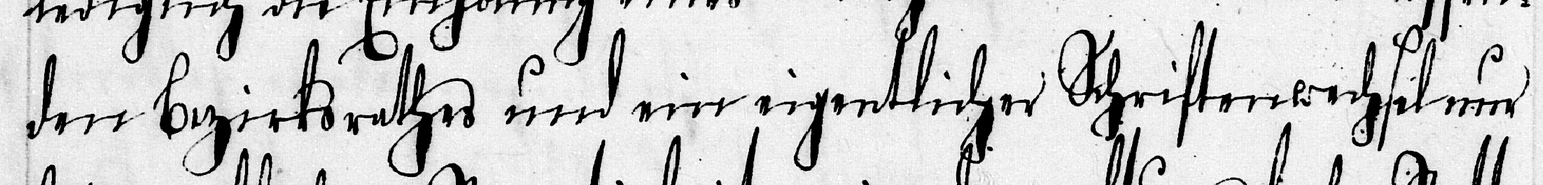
den Bezirksrathes und ein eigentlicher Schriftenwechsel nur
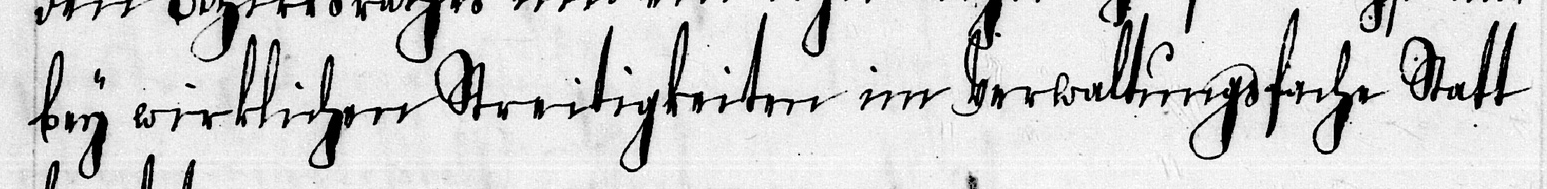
bey wirklichen Streitigkeiten im Verwaltungsfache Statt
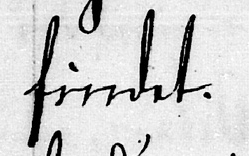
findet.
